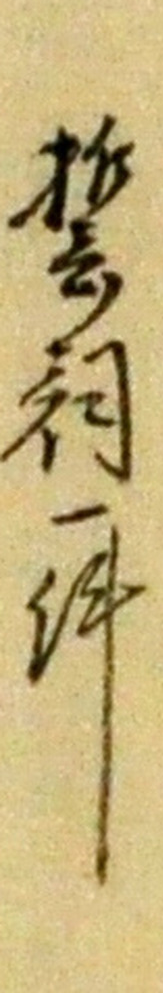誓詞一件
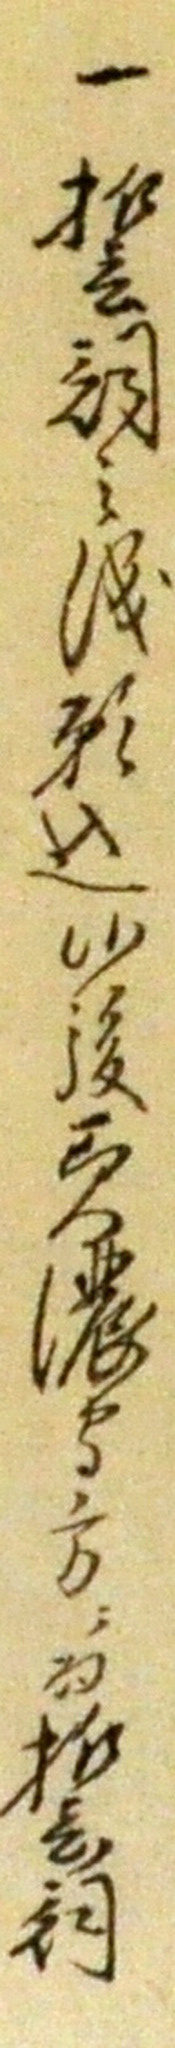一誓詞之儀頼込以後美濃守方に而誓詞
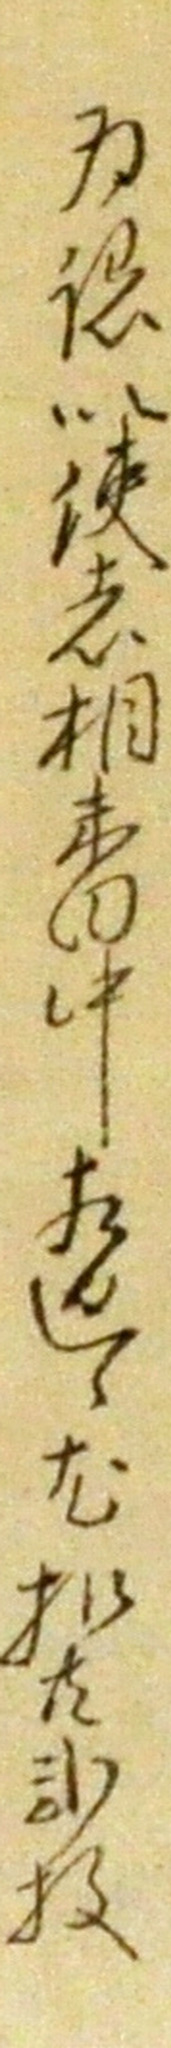為認以使者相番中相廻候尤扣共弐枚
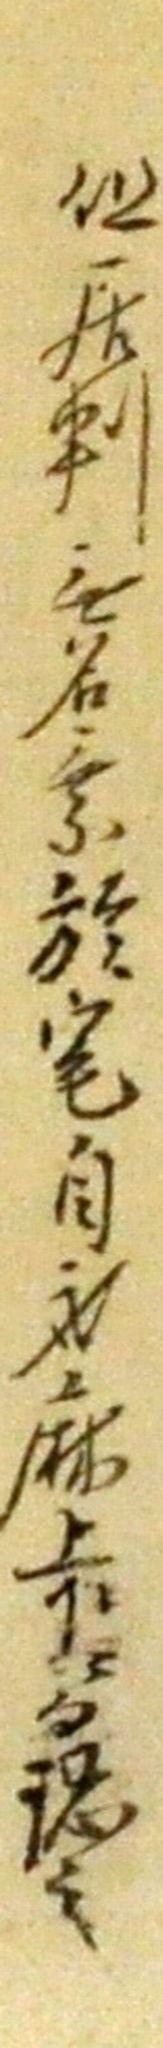但居判無名乗於宅自身麻上下に而認之
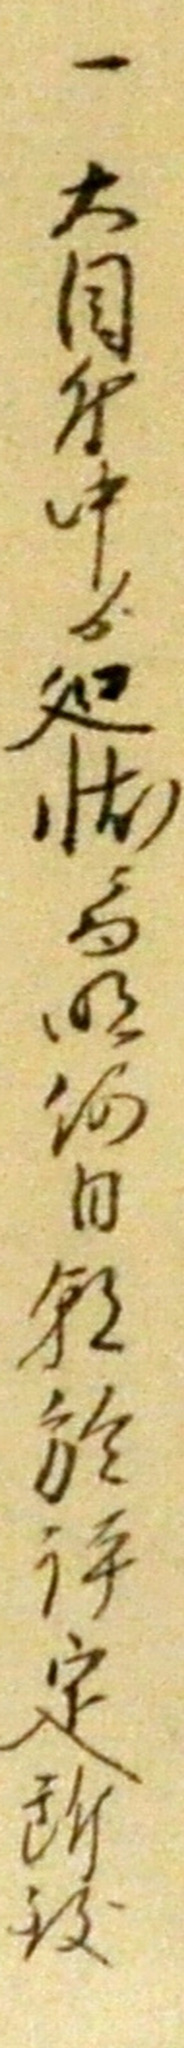一大目付中ゟ廻状に而明何日朝於評定所致
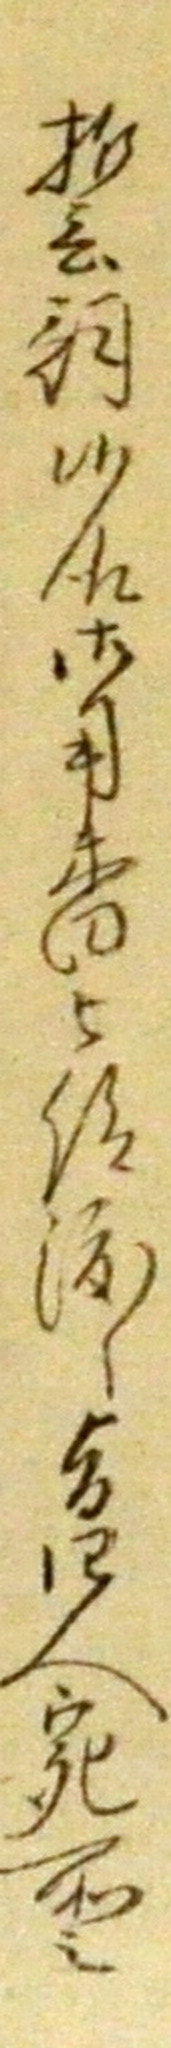誓詞候様御用番被仰渡候旨四人宛所之
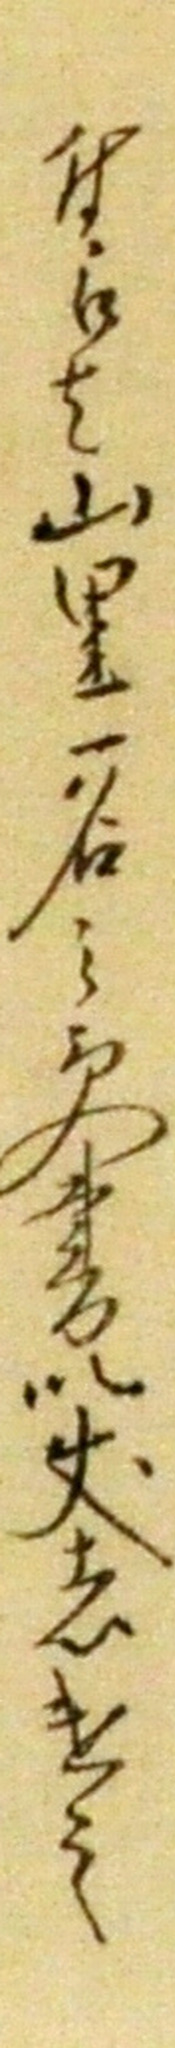付えは山里一名之受書以使者遣之
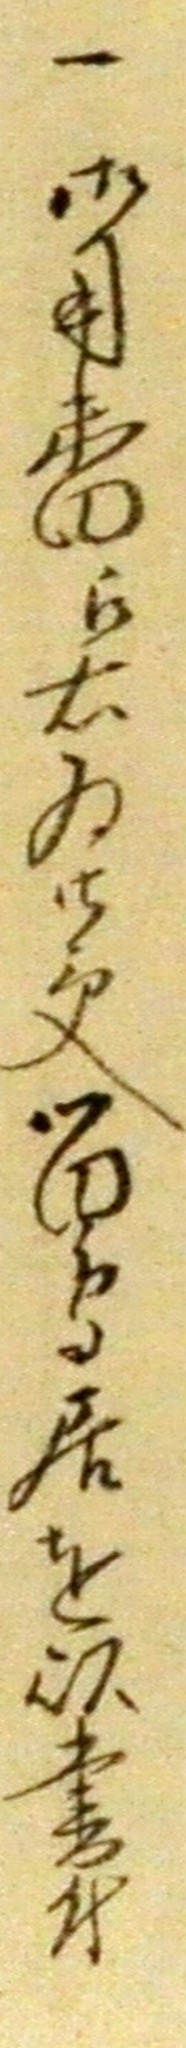一御用番え右為御受留守居を以書付遣之
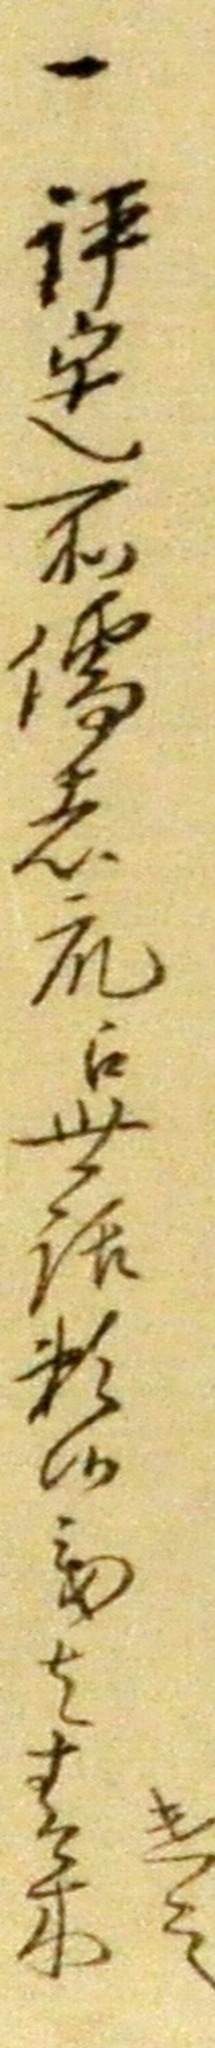一評定所儒者衆え世話頼候義は青木
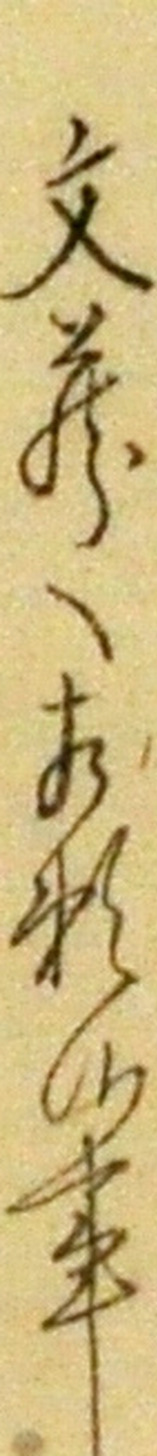文蔵へ相頼候事
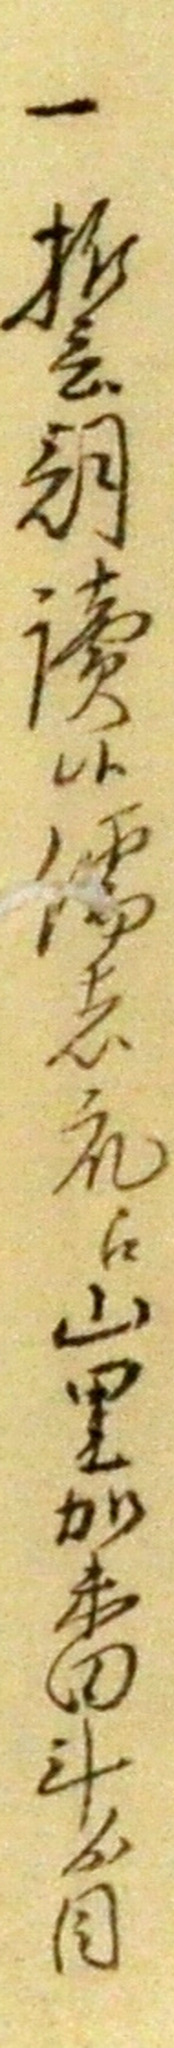一誓詞読候儒者衆え山里加番計ゟ目
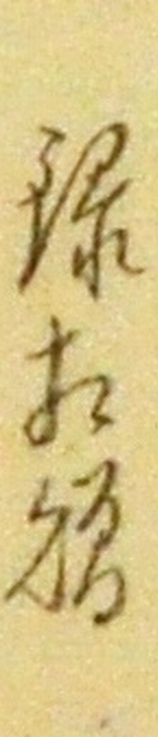録相贈
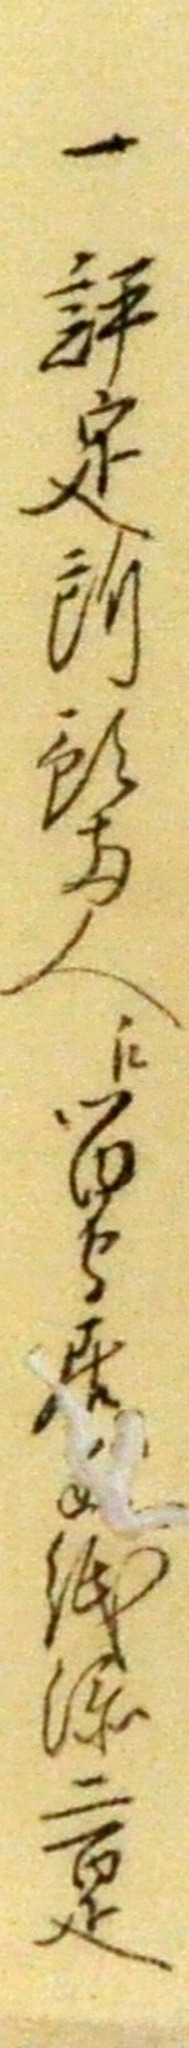一評定所預両人え留守居手紙添二百疋
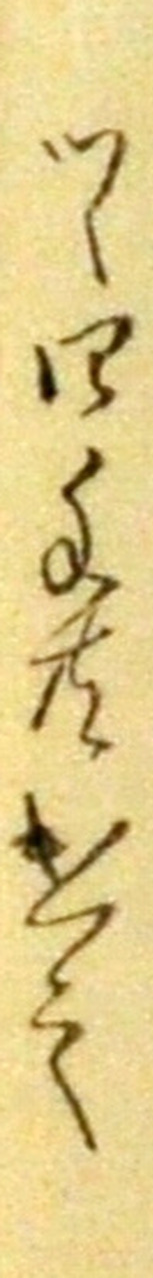ツヽ四手共遣之

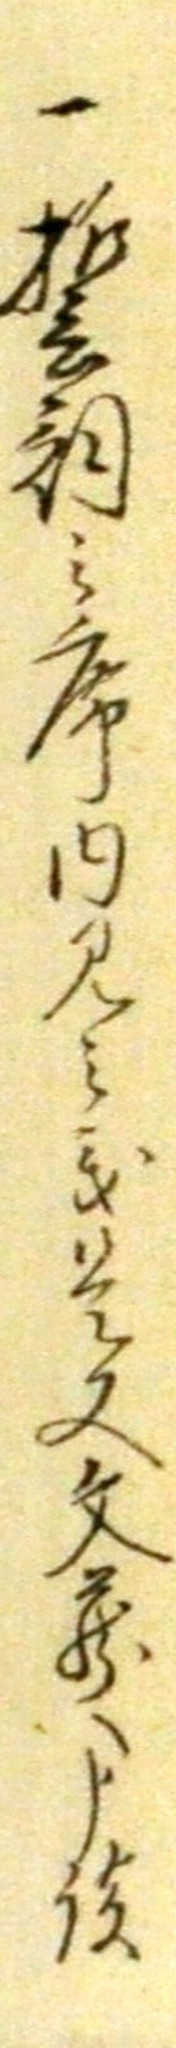一誓詞之序内見之義是又文蔵へ申談
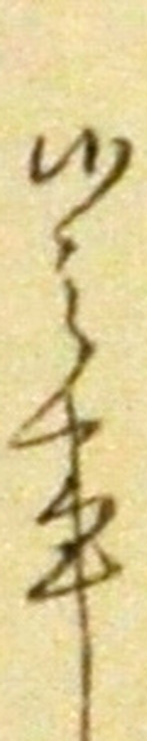候之事
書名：大阪加番関係諸書留〔一括〕
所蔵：伊那市立高遠町図書館・合同会社AMANE
